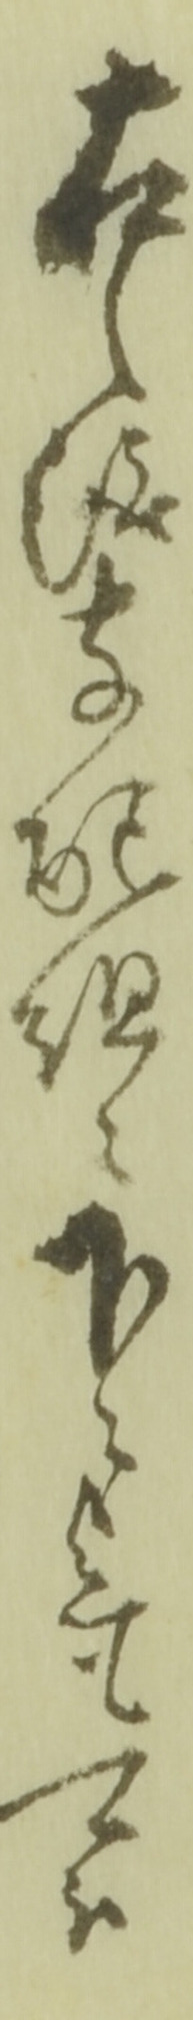右之趣支配組々下々迄も可被
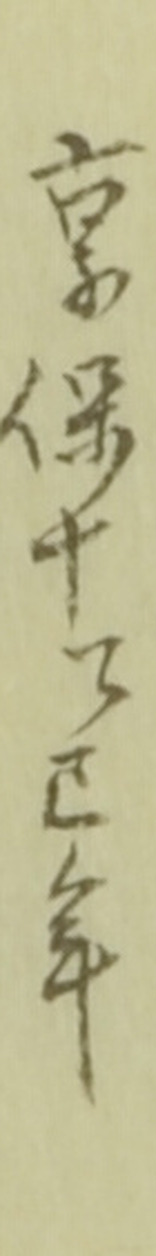享保十年乙巳年
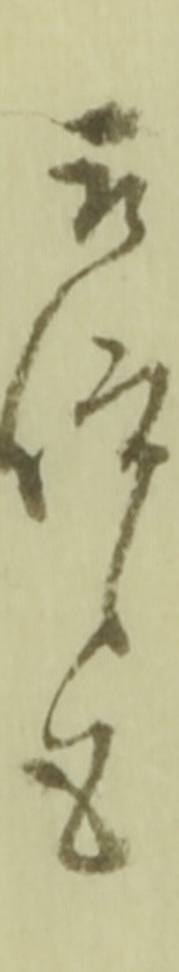被仰候以上
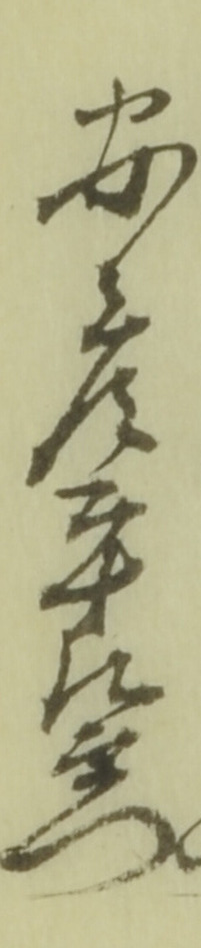安彦平左衛門
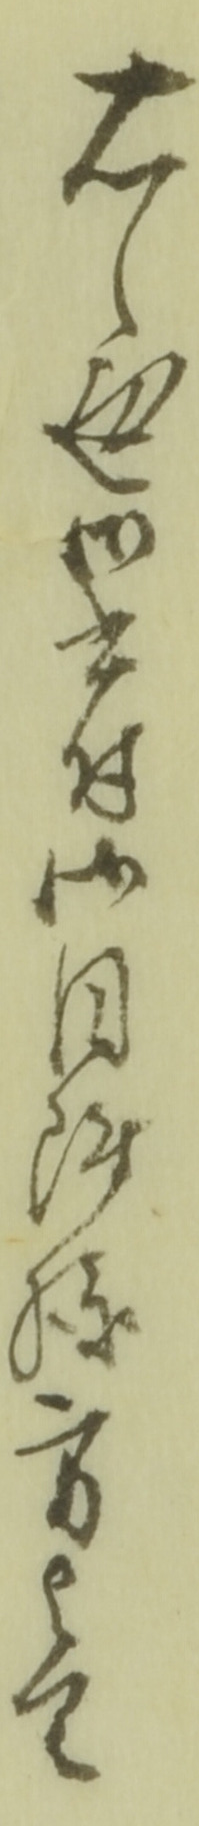右之通御書付御目附様方より
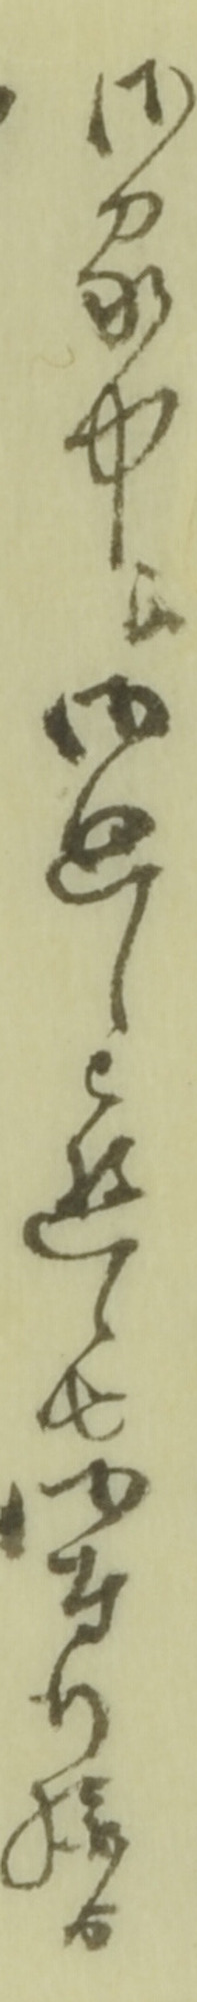御家中江御廻し被遊候由御奉行様ゟ
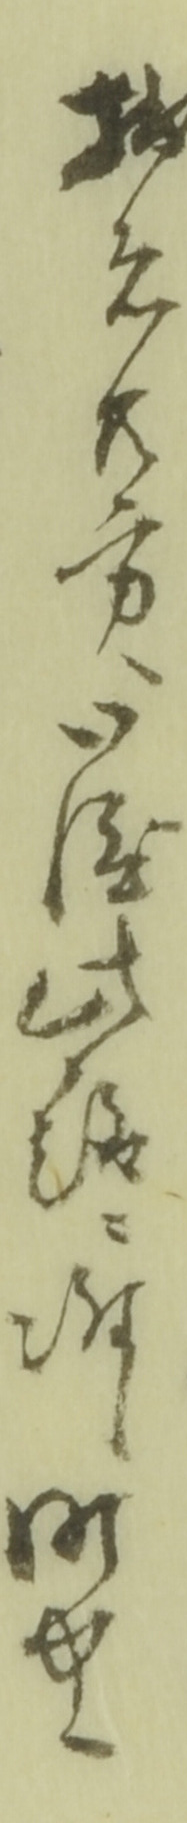拙者共方へ御渡此趣二准し町中へ
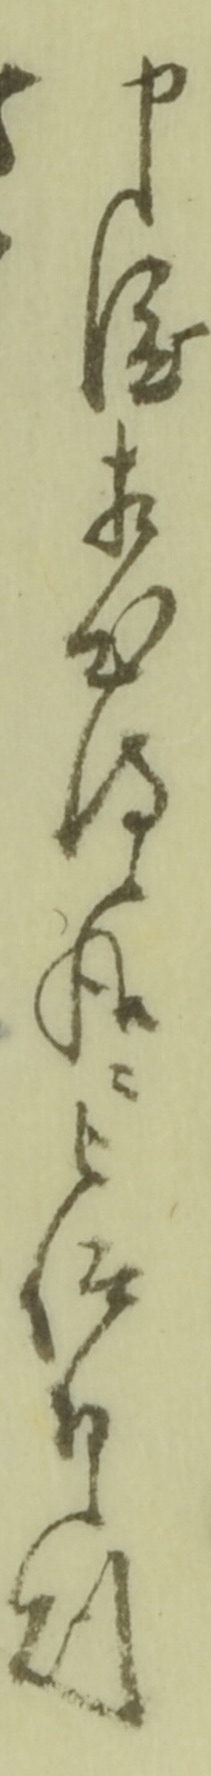申渡相心得候様ニ被仰付候則
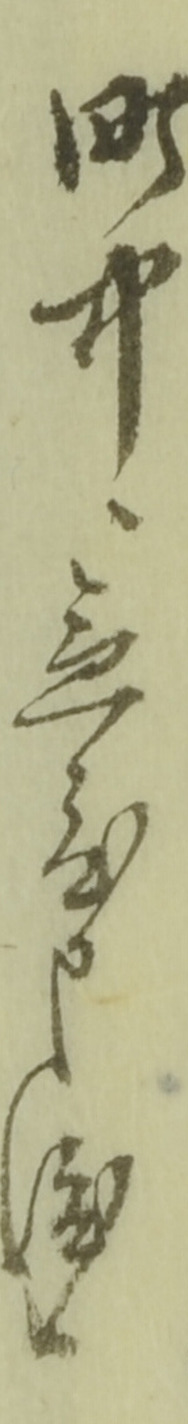町中へ急度申渡候

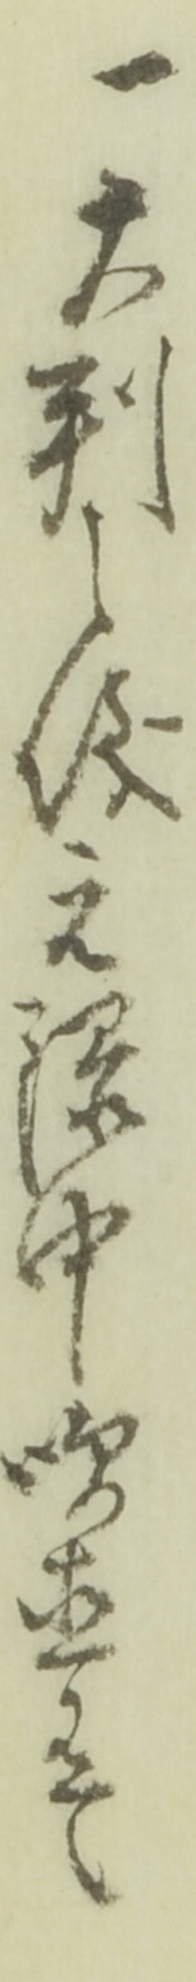一大判之儀元禄中吹直有之
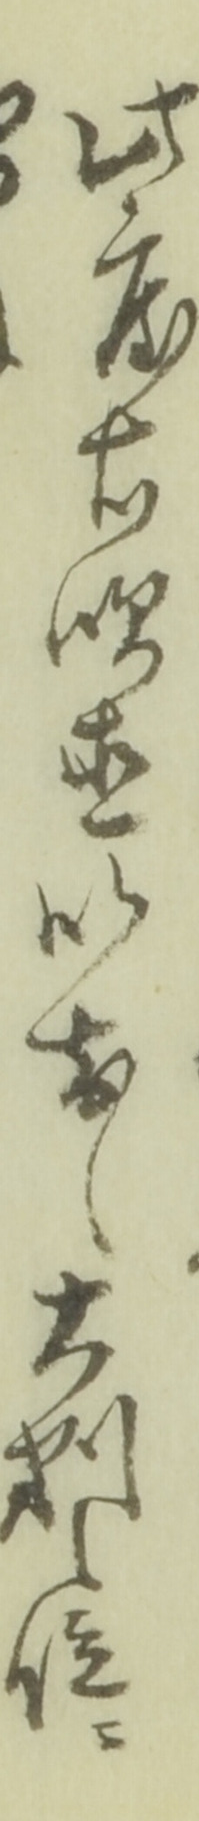此度右吹直以前之大判之位ニ
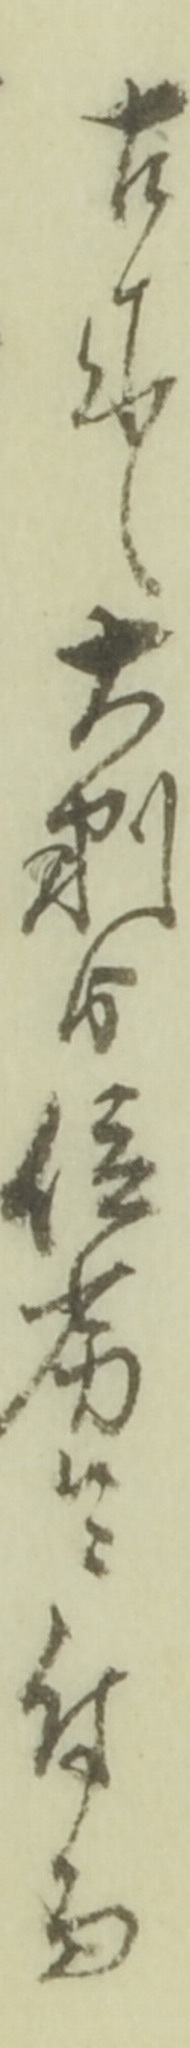古来之大判ゟ位劣候二付而
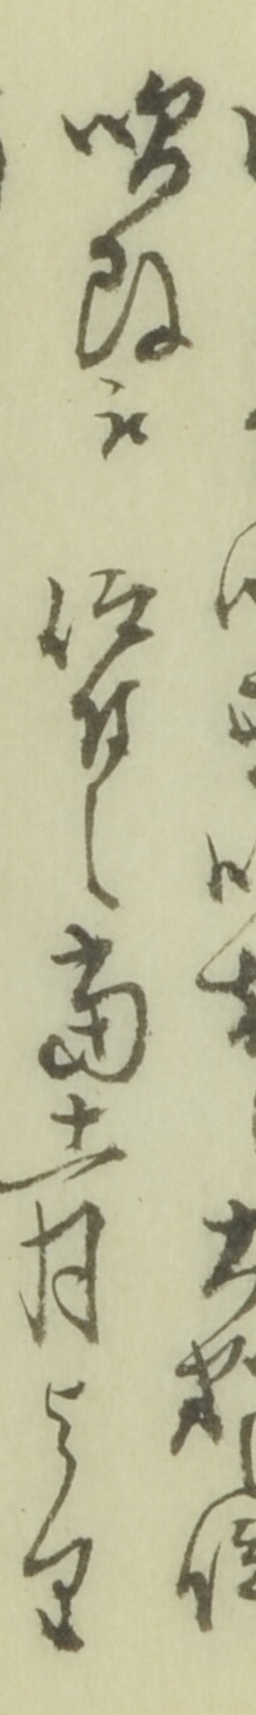吹改被仰付之当十一月より
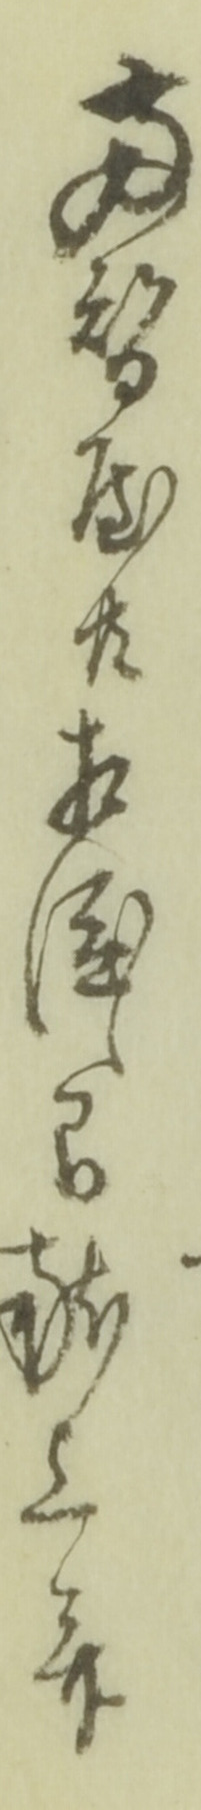両替屋共相渡候間献上并
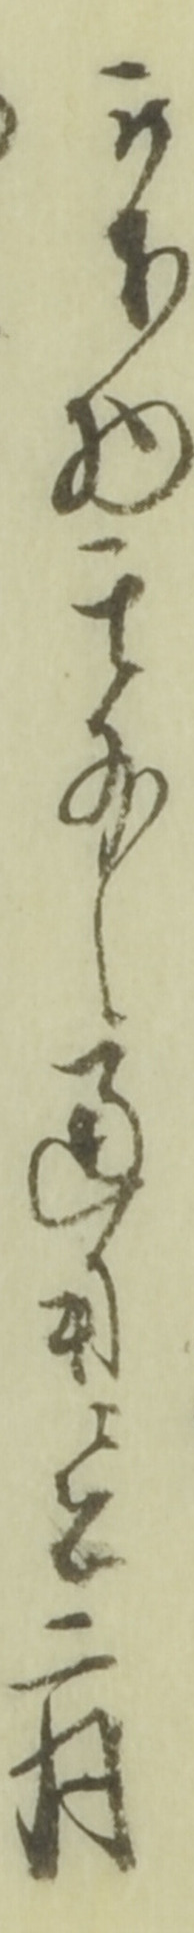被下物其外之通用ニ者二月
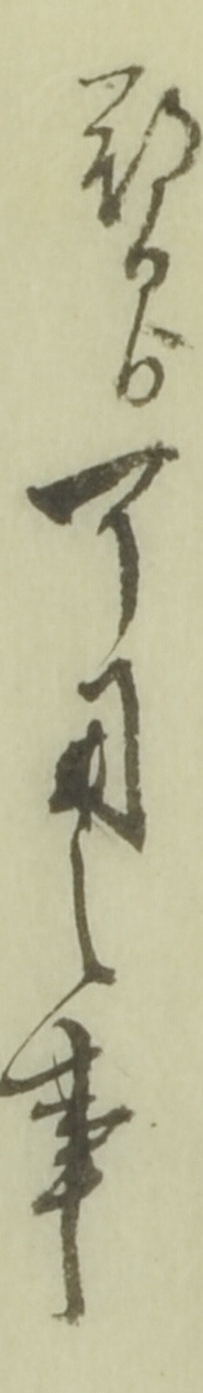朔日ゟ可用之事
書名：御公儀様御領主様御触書控
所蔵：伊那市立高遠町図書館・合同会社AMANE
